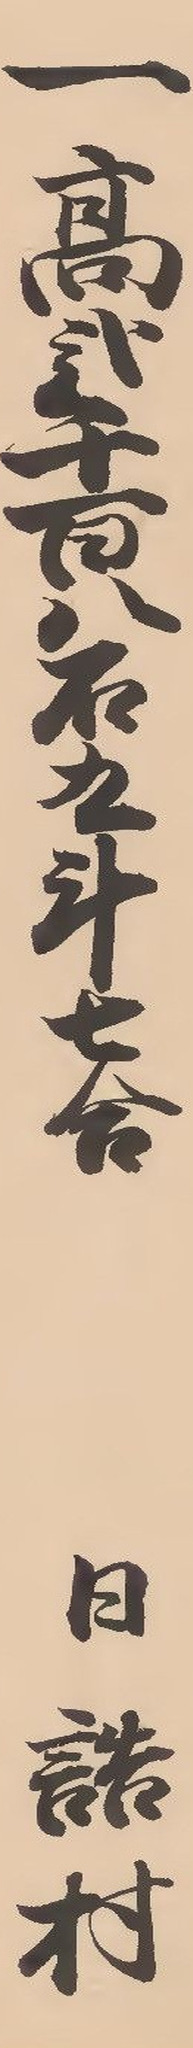一高弐千百八石九斗七合日詰村
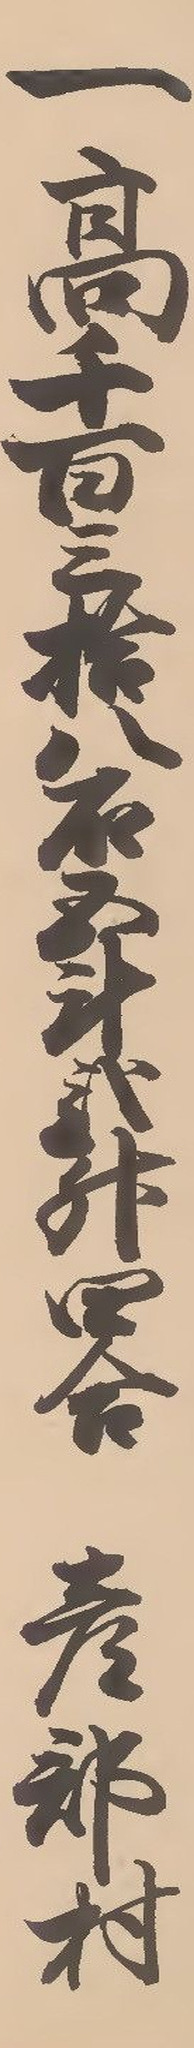一高千百三拾八石五斗弐升四合彦部村
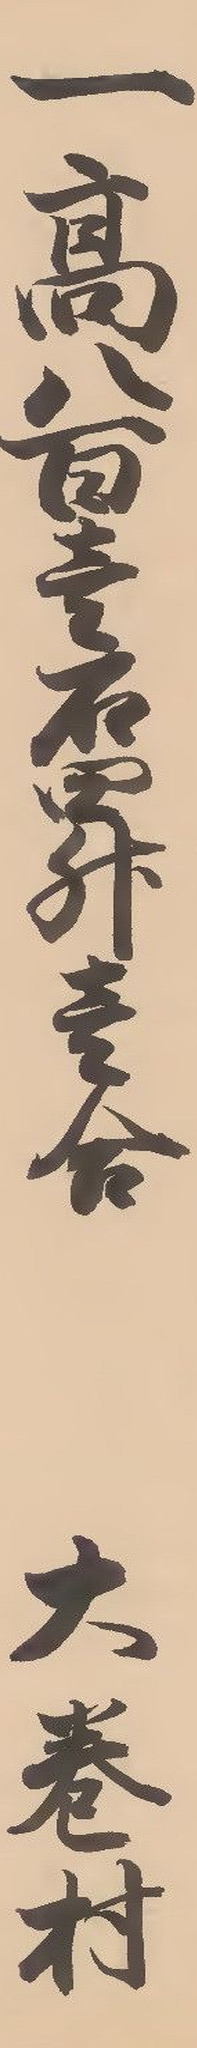一高八百壱石四升壱合大巻村
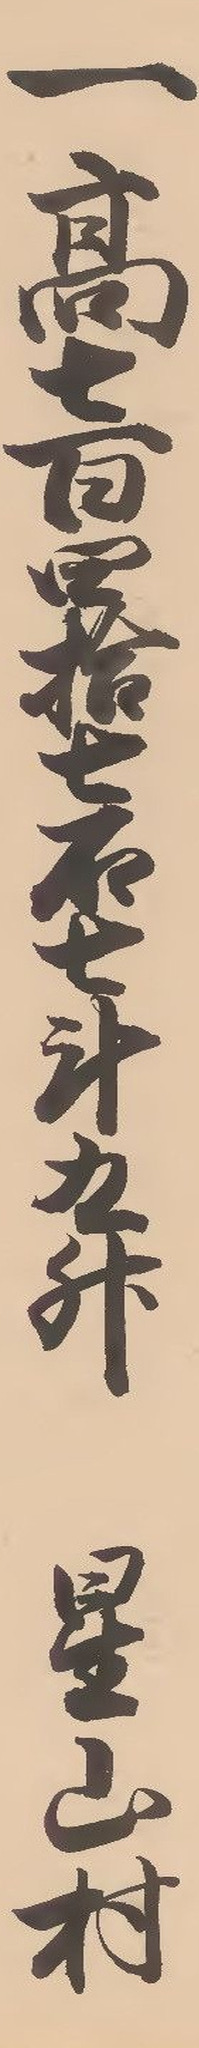一高七百四拾七石七斗九升星山村
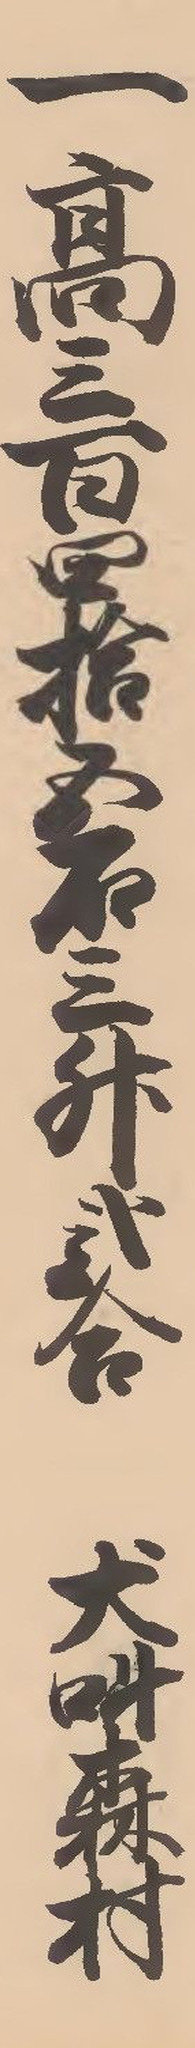一高三百四拾五石三升弐合犬叫森村

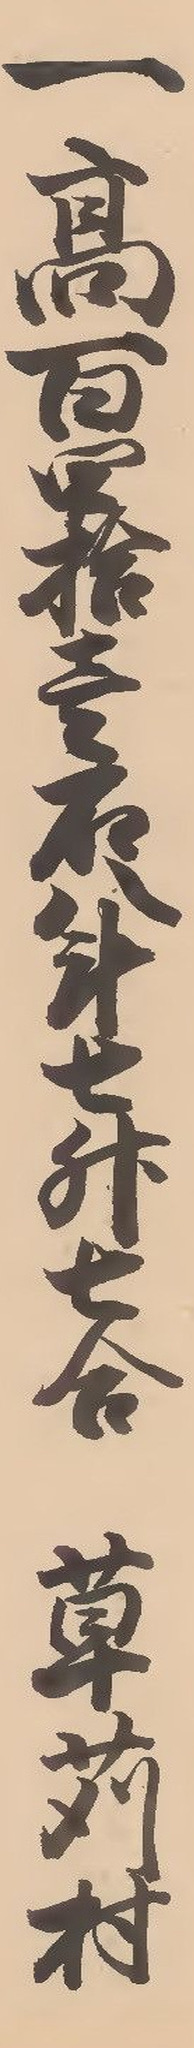一高百四拾壱石八斗七升七合草刈村
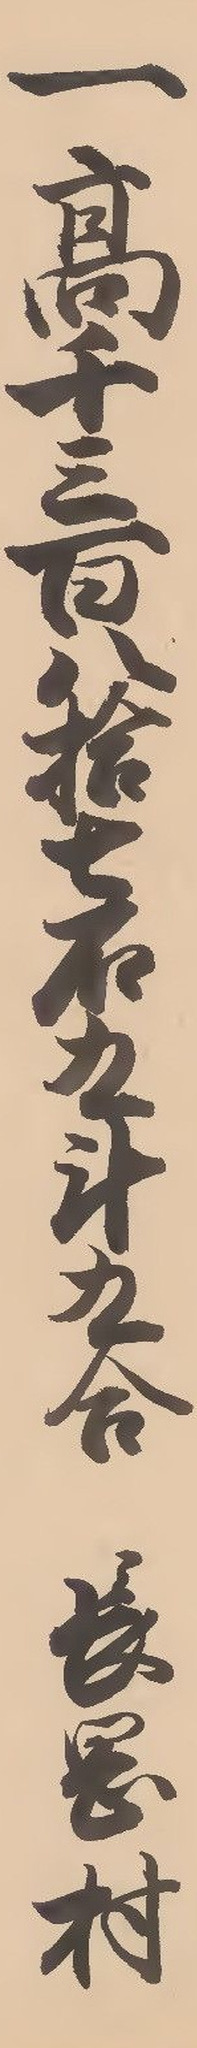一高千三百八拾七石九斗九合長岡村
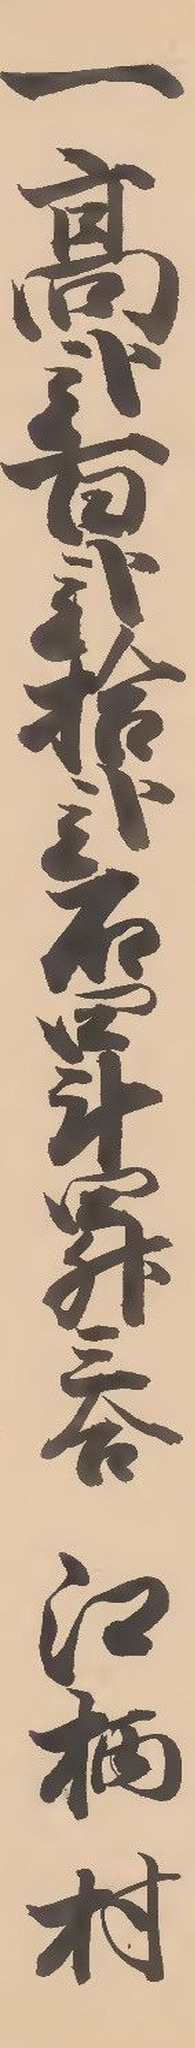一高弐百弐拾弐石四斗四升三合江柄村
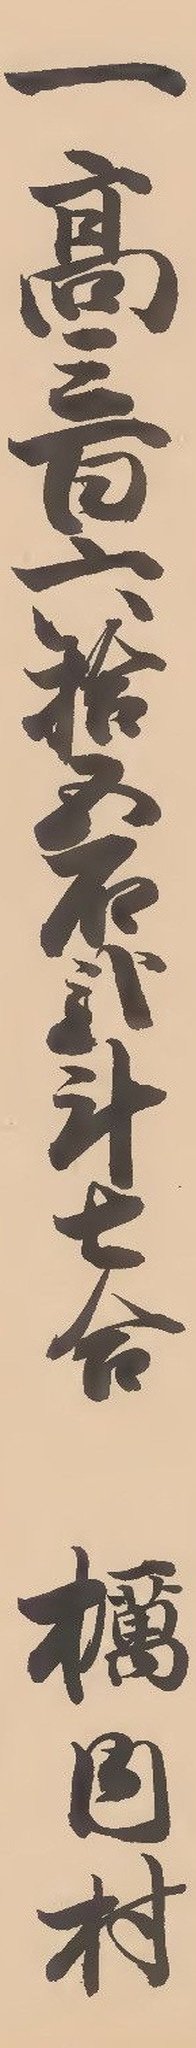一高三百六拾五石弐斗七合栃内村
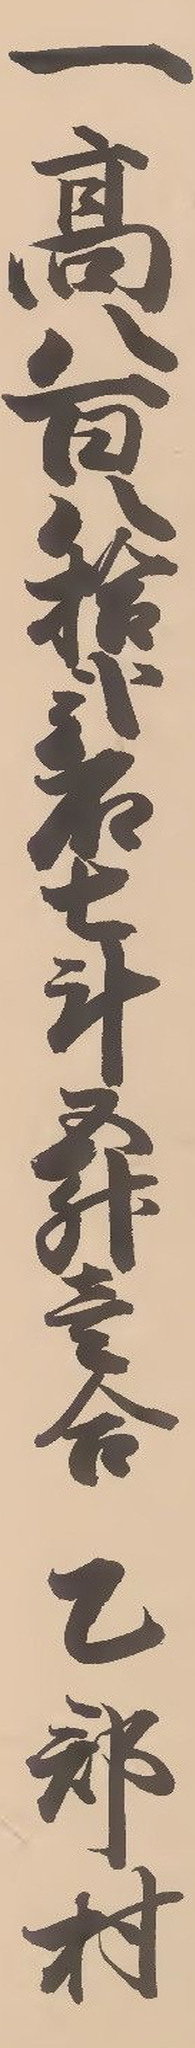一高八百八拾弐石七斗五升壱合乙部村
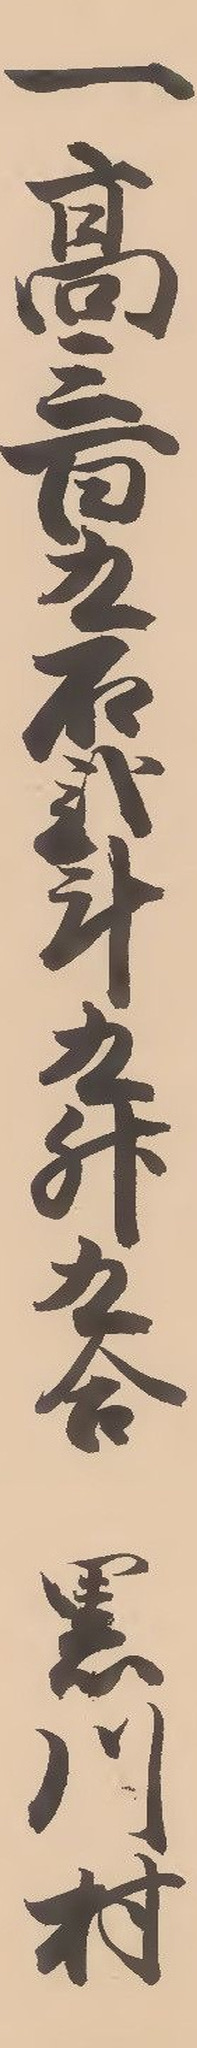一高三百九石弐斗九升九合黒川村
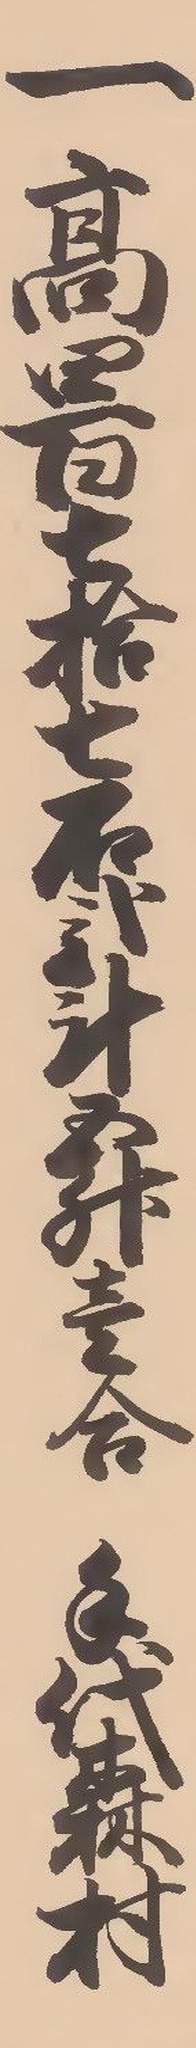一高四百七拾七石弐斗五升壱合手代森村
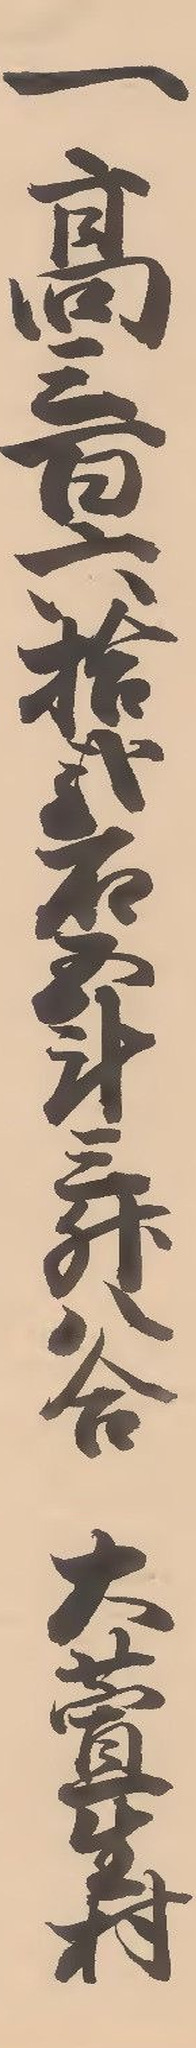一高三百六拾弐石五斗三外八合大萱生村

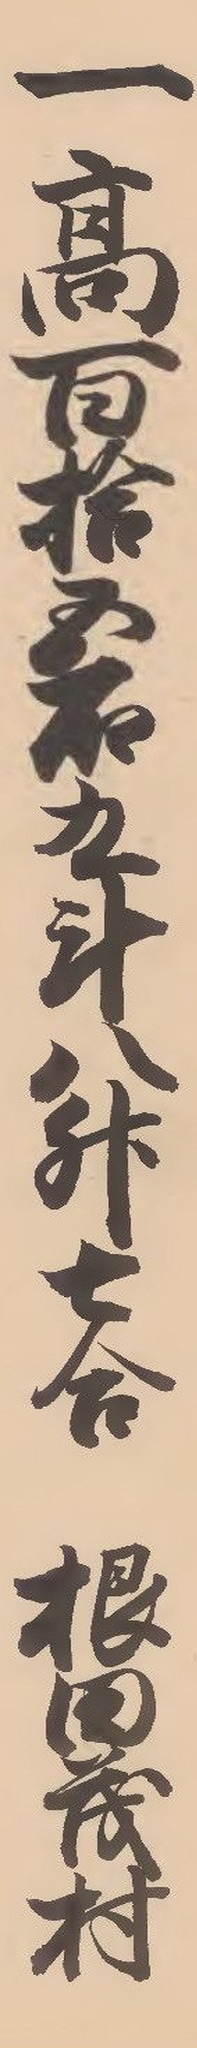一高百拾五石九斗八升七合根田茂村
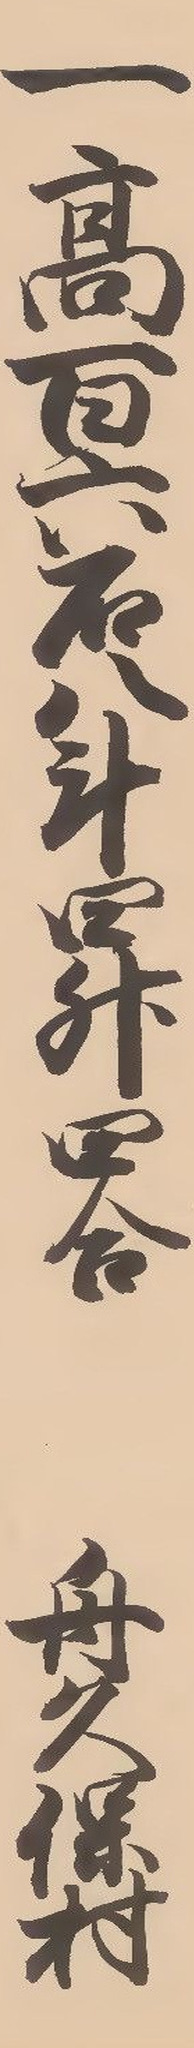一高百六石八斗四升四合舟久保村
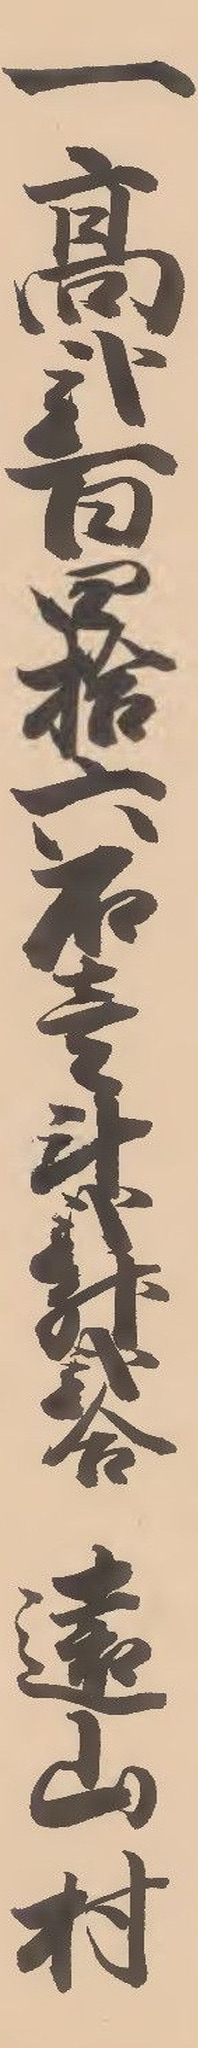一高弐百四拾六石壱斗弐升弐合遠山村
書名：陸奥国郷帳　６
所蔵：国立公文書館 National Archives of Japan
